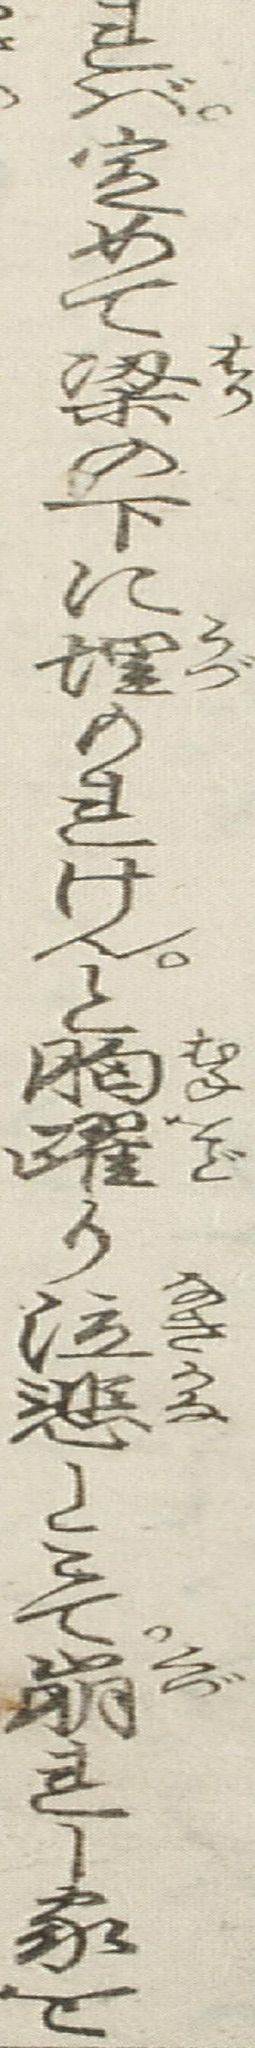れば。定めて梁の下に埋もれけん。と胸躍り泣悲しみて。崩れし家を
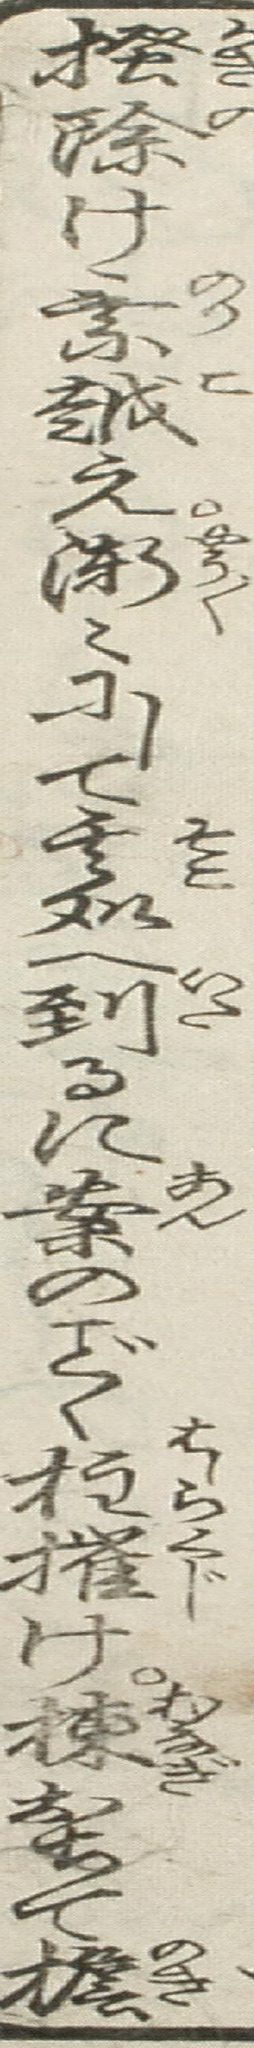掻除け乗越え。漸〻にして其処へ到るに案のごとく柱摧け。棟おちて檐
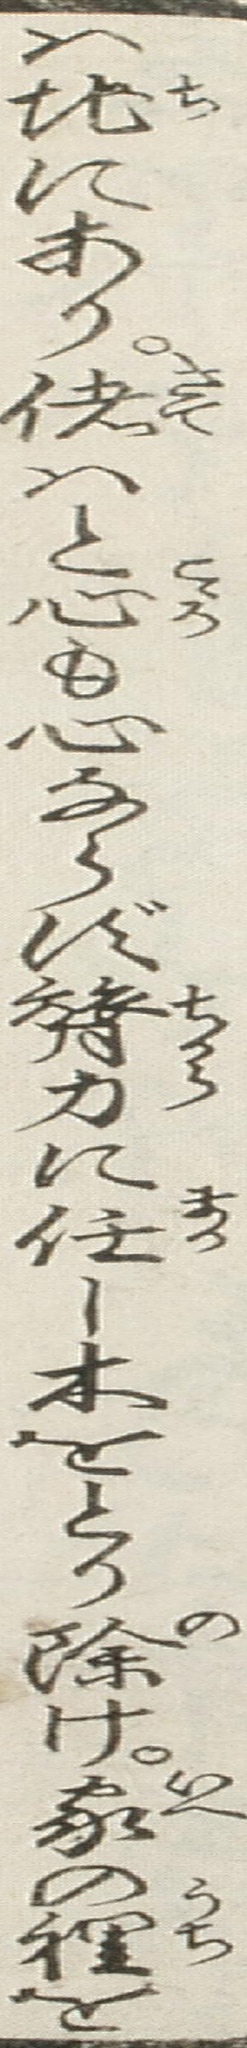は地にあり。偖はと心もならず膂力に任し木をとり除け。家の裡を
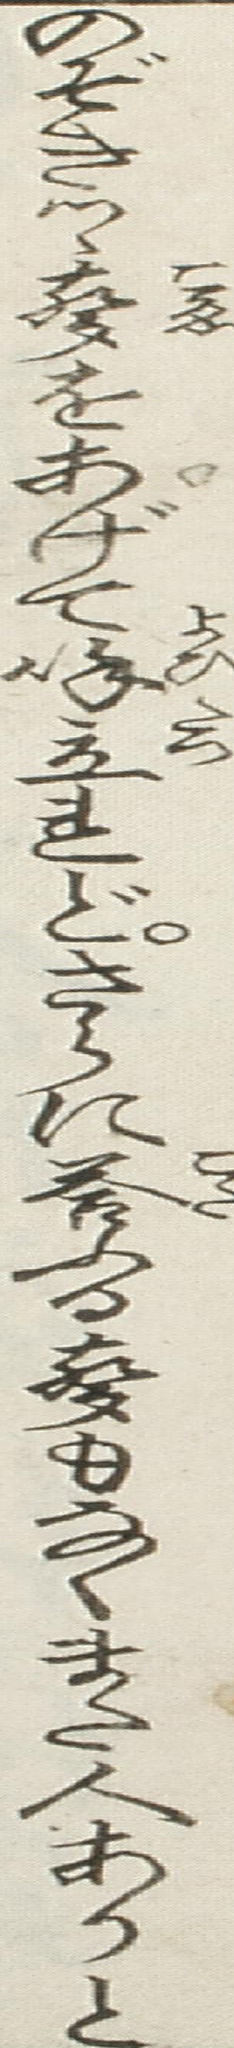のぞきつゝ声をあげて呼立れど。さらに答ふる声もなくまた人ありと
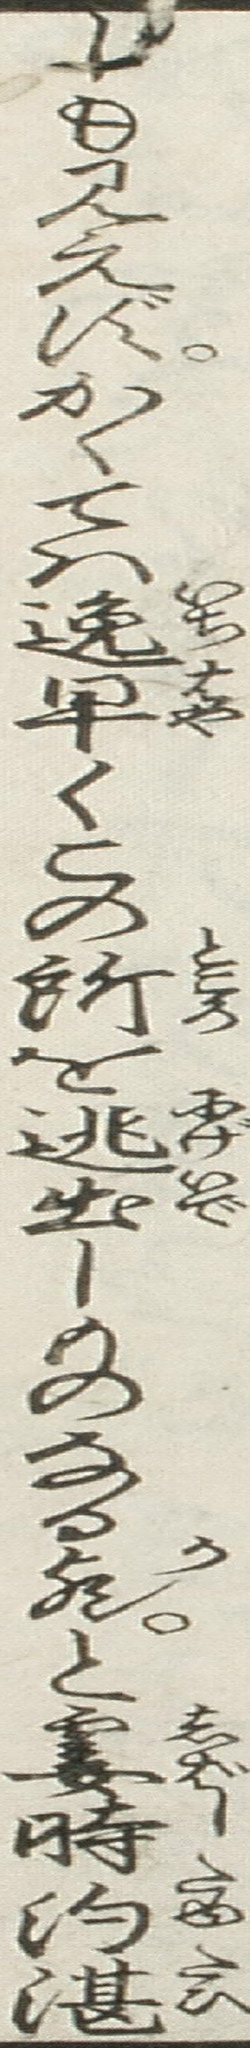しも見えず。かくては逸早くこの所を逃出しものなる歟。と霎時汋湛
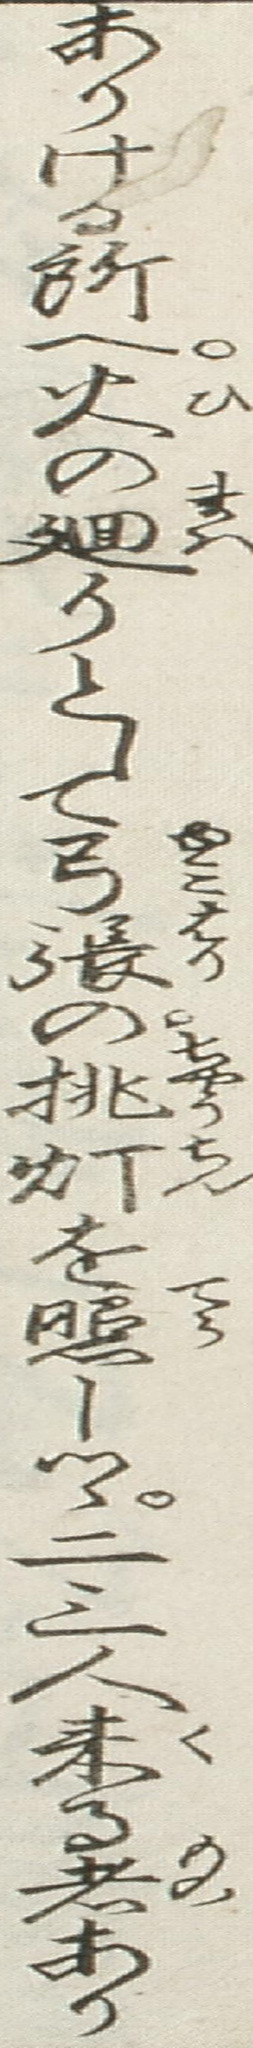ありける所へ。火の廻りとして弓張の。挑灯を照しつゝ。二三人来る者あり
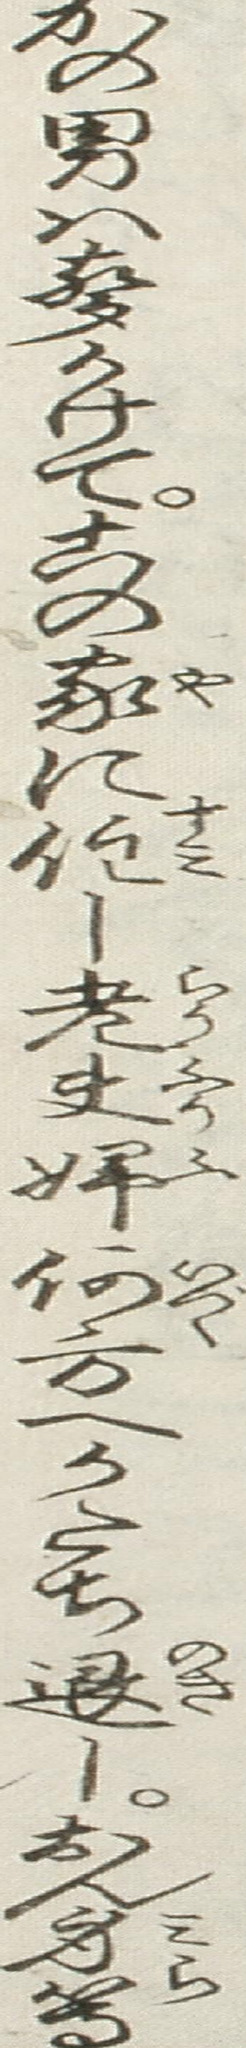かの男は声かけて。この家に住し老夫婦何方へかたち退し。おん身等
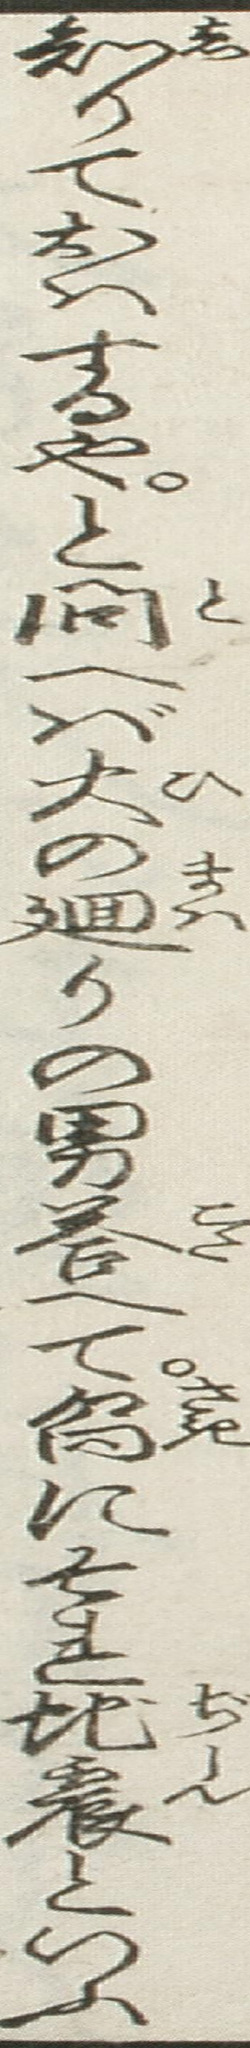知りておはするや。と問へば火の廻りの男答へて。嚮にそれ地震といふ
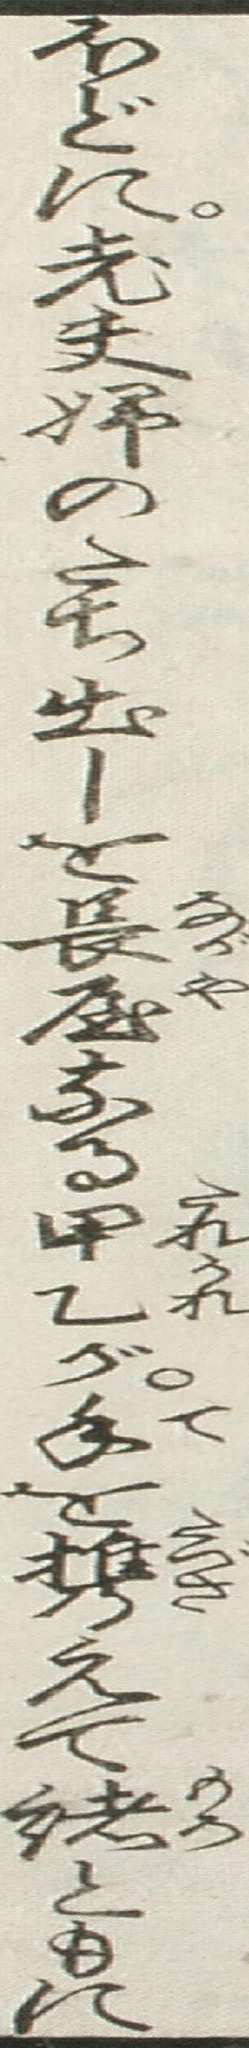ほどに。老夫婦のたち出しを長屋なる甲乙が。手を携えて諸ともに
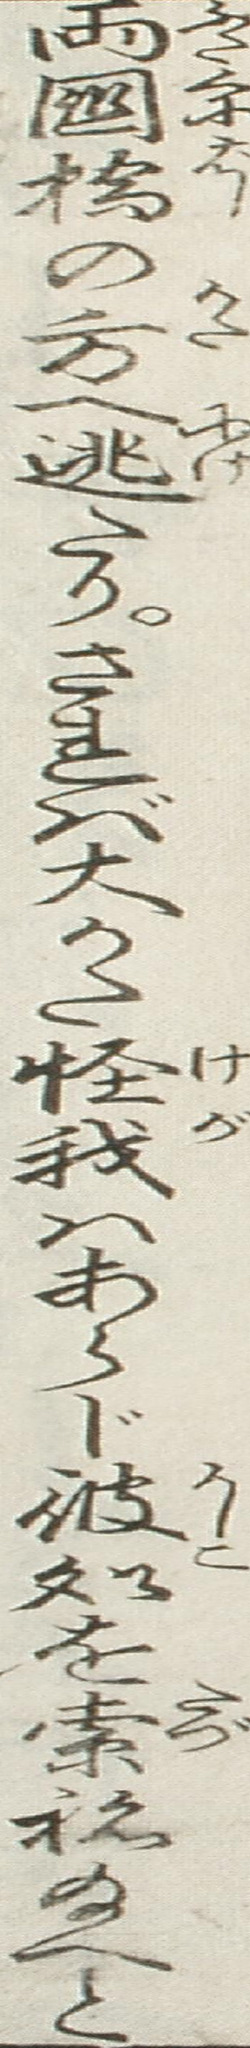両国橋の方へ逃たり。されば大かた怪我はあらじ彼処を索ね給へと
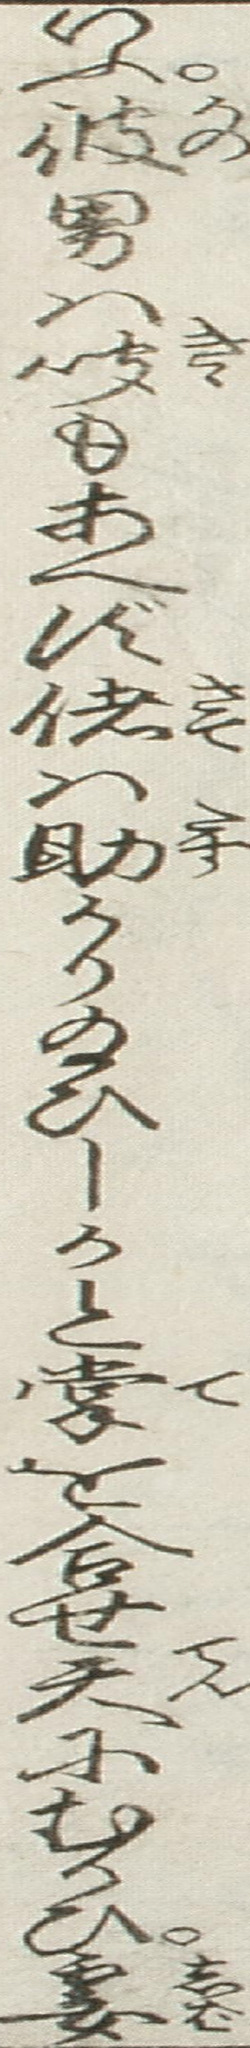いふ。彼男は聞もあへず偖は助かり給ひしかと掌を合せ天にむかひ。霎
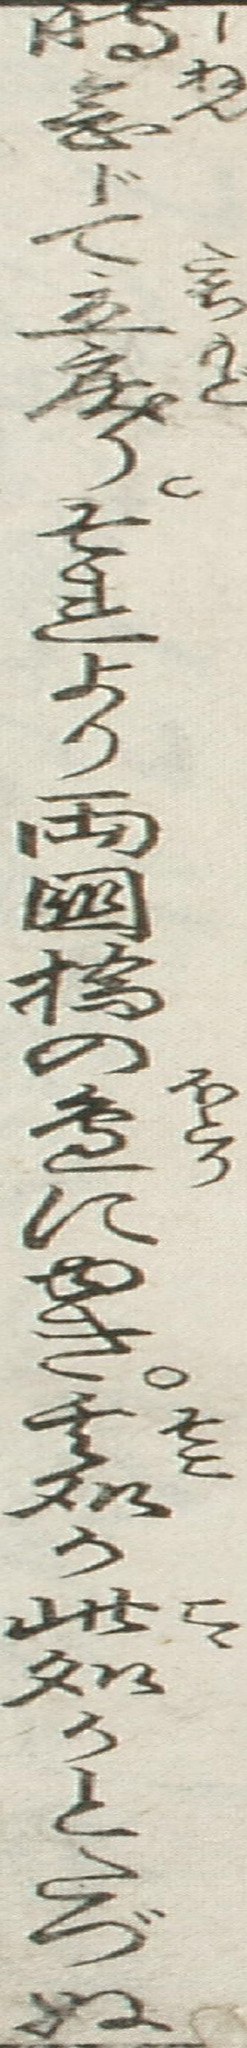時念じて立戻り。それより両国橋の辺にゆき。其処か此処かとたづぬ
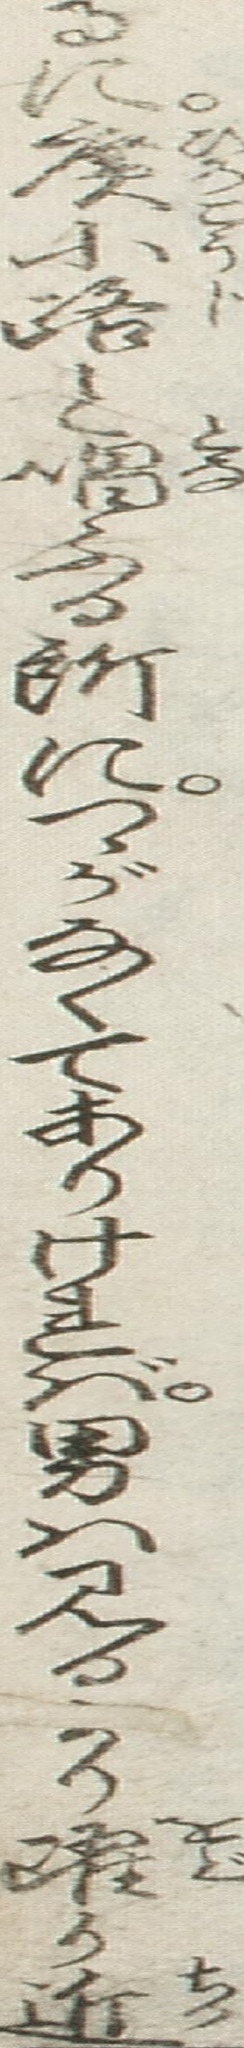るに。広小路と唱ふる所に。つゝがなくてありければ。男は見るより躍り近

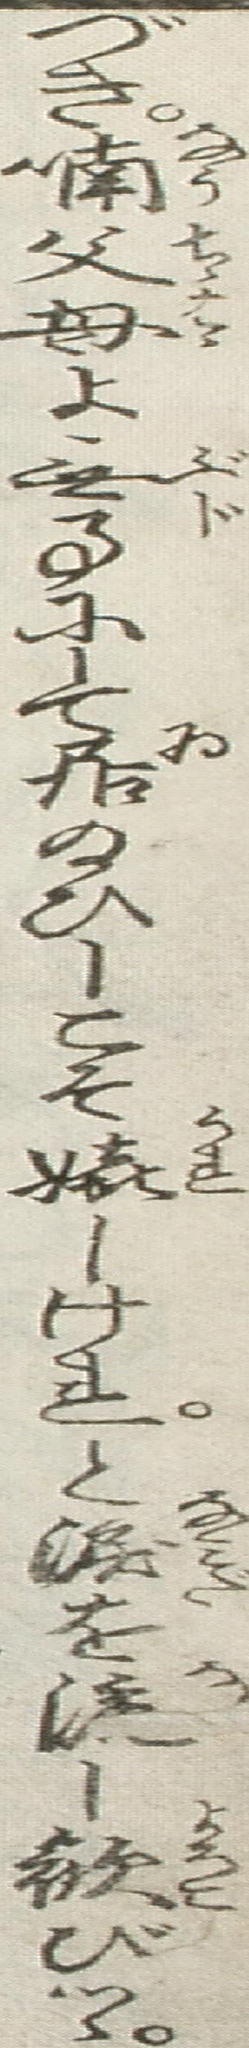づき。喃父母よ無事にして居給ひしこそ嬉しけれ。と涙し歓びつゝ。
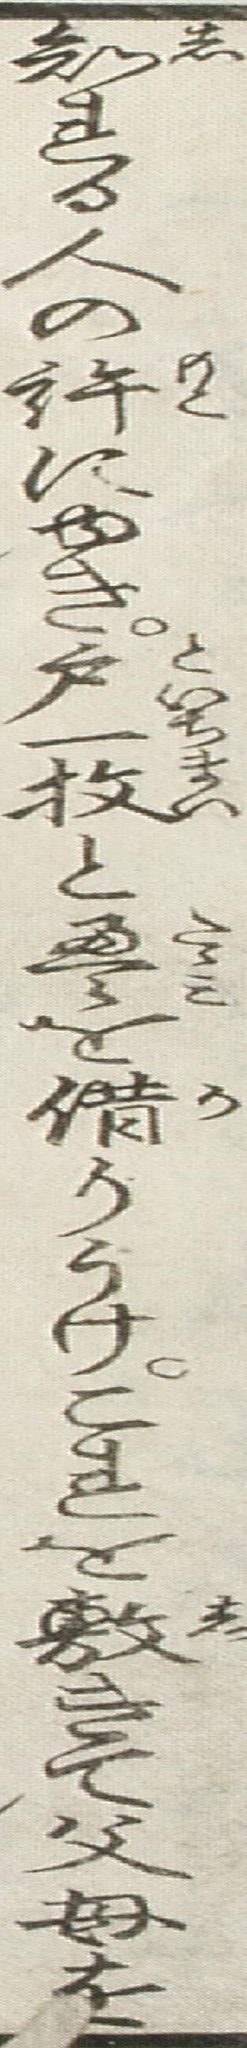知れる人の許にゆき。戸一枚と畳を借りうけ。これを敷きて父母を
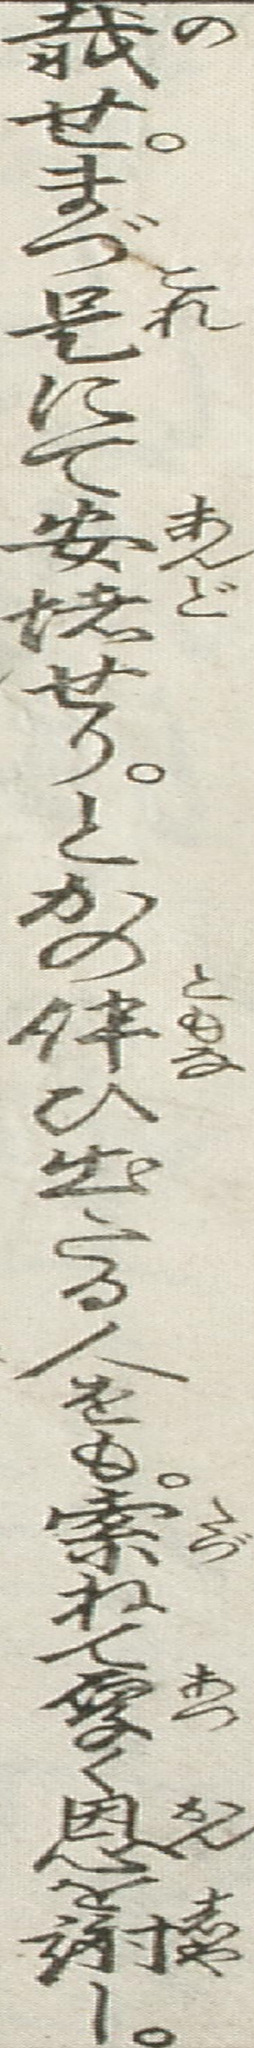載せ。まづ是にて安堵せり。とかの伴ひ出たる人をも。索ねて厚く恩を謝し。
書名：安政見聞録　下
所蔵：東京大学地震研究所図書室 Earthquake Research Institute Library, The University of Tokyo, JAPAN
